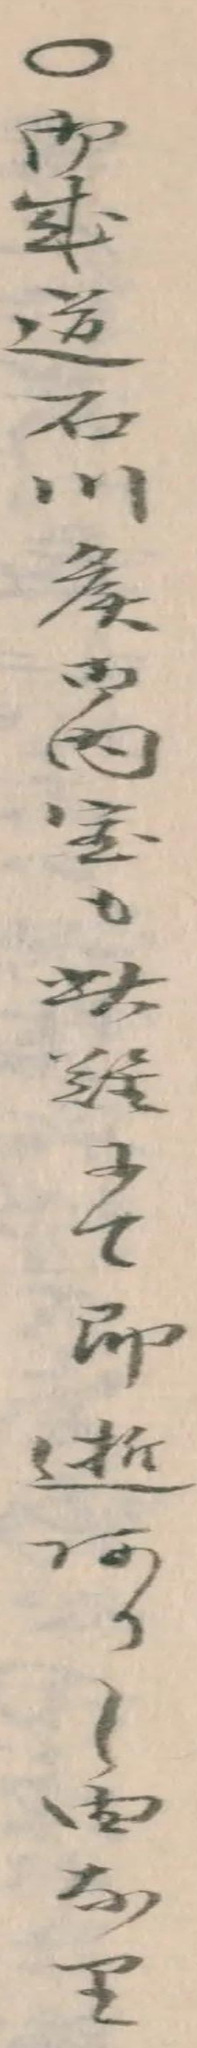〇御成道石川侯御内室も此難にて即逝ありし由なり
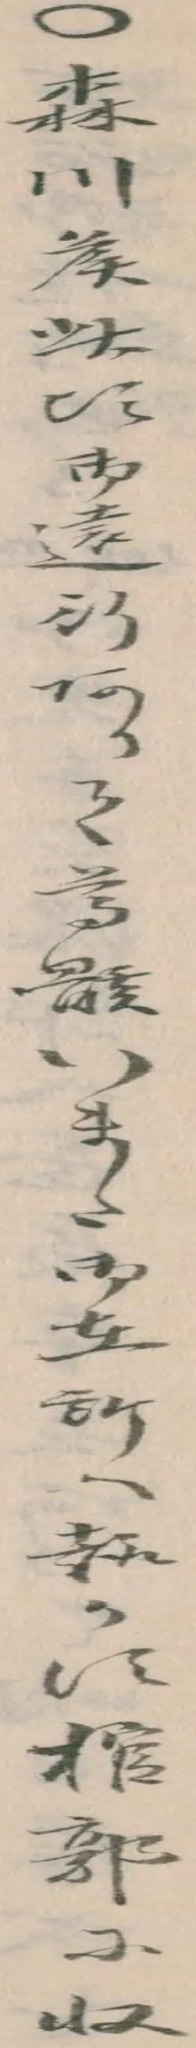〇森川侯此頃御遠行ありて尊骸いまた御在所へ趣かす棺郭に収
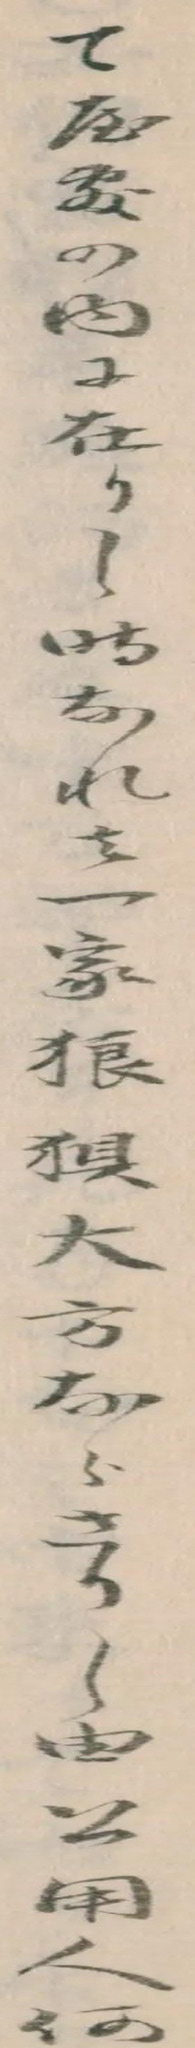て屋敷の内に在りし時なれは一家狼狽大方ならさりし由公用人何
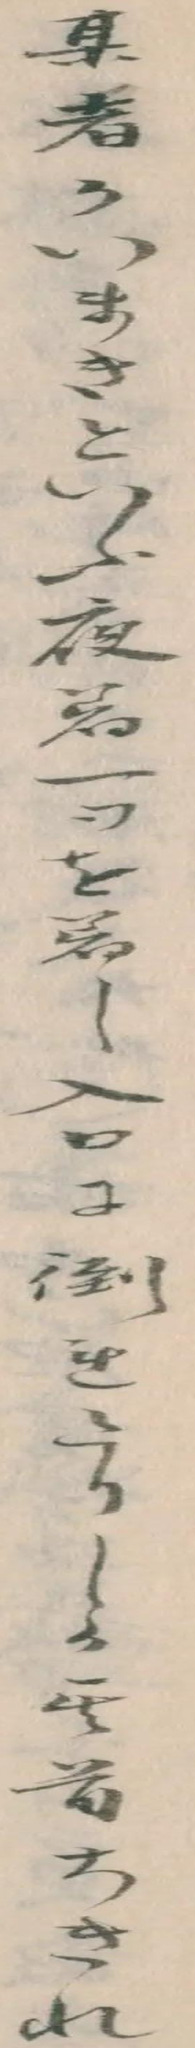某はかいまきといふ夜着一ツを着し入口に倒れたりしか其首ちきれ
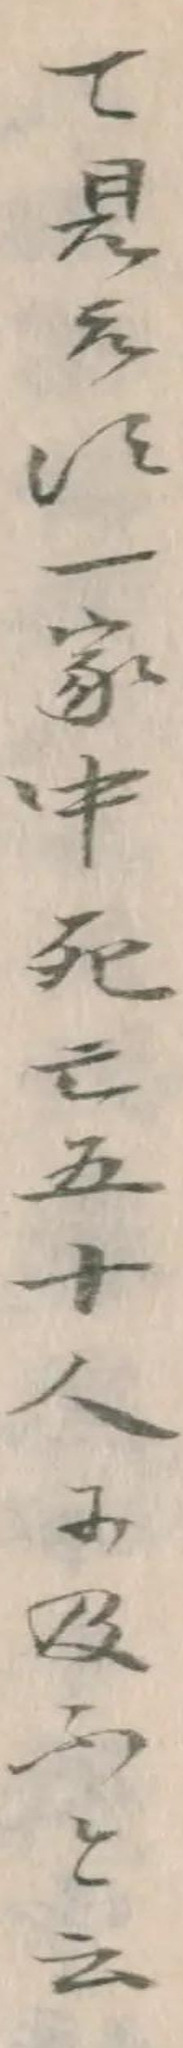て見えす一家中死亡五十人に及ふと云
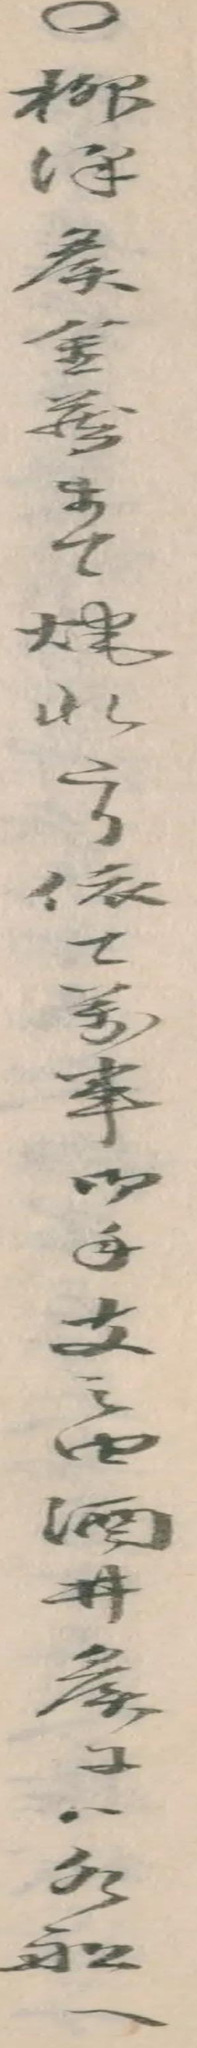〇柳沢侯金蔵まて焼れたり依て万事御手支之由酒井侯には水船へ
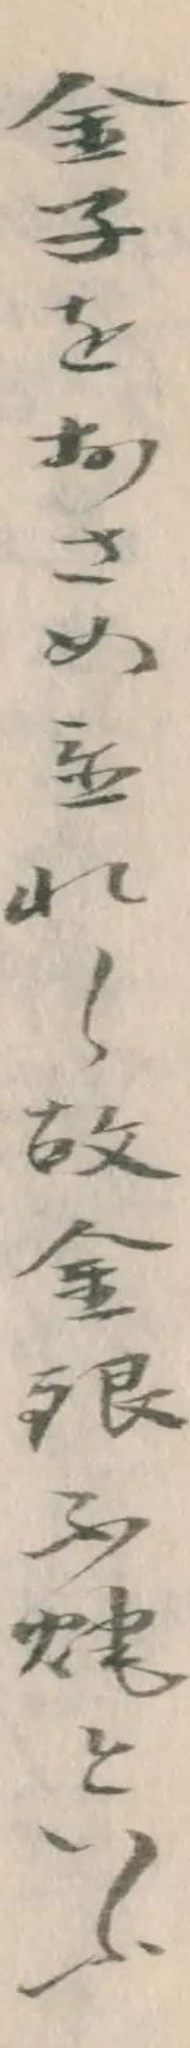金子をおさめ置れし故金銀不焼といふ
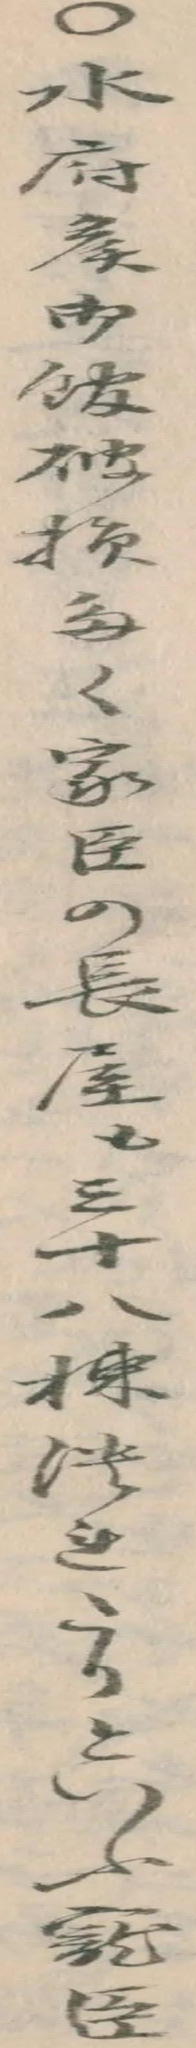〇水府侯御館破損多く家臣の長屋も三十八棟潰れたりといふ寵臣

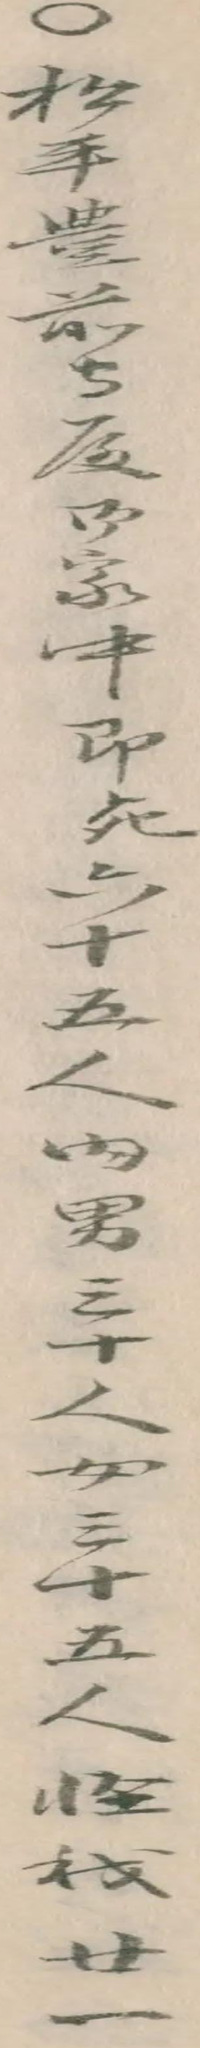〇松平豊前守殿御家中即死六十五人内男三十人女三十五人怪我廿一
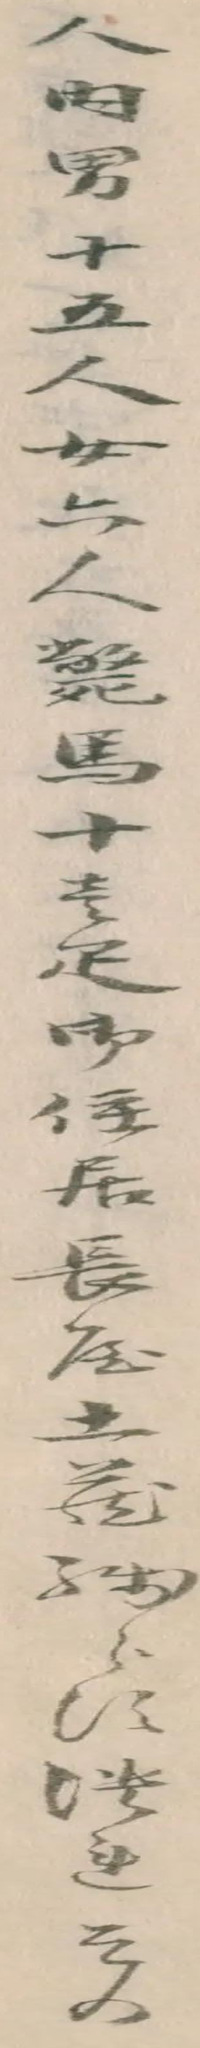人内男十五人女六人斃馬十壱疋御住居長屋土蔵残らす潰れその
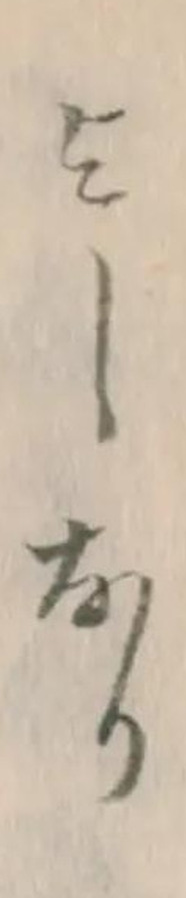よしなり
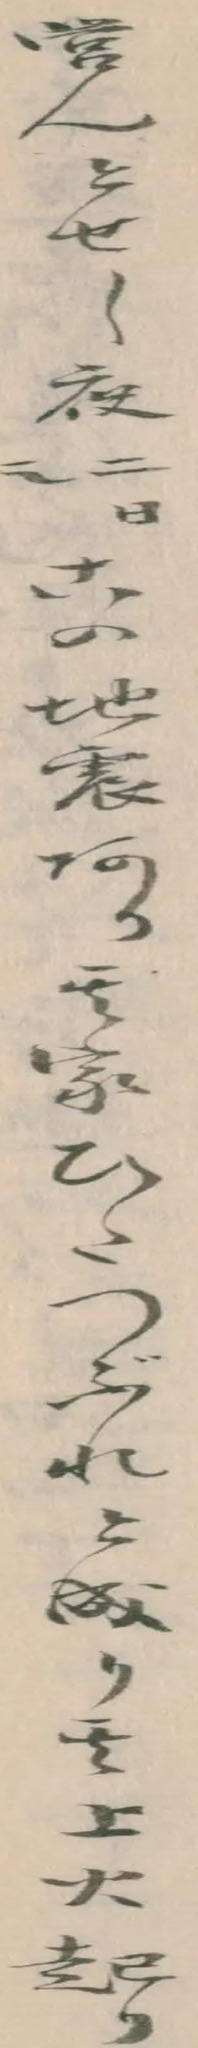営んとせし夜二日也この地震あり其家ひたつぶれと成り其上火起り
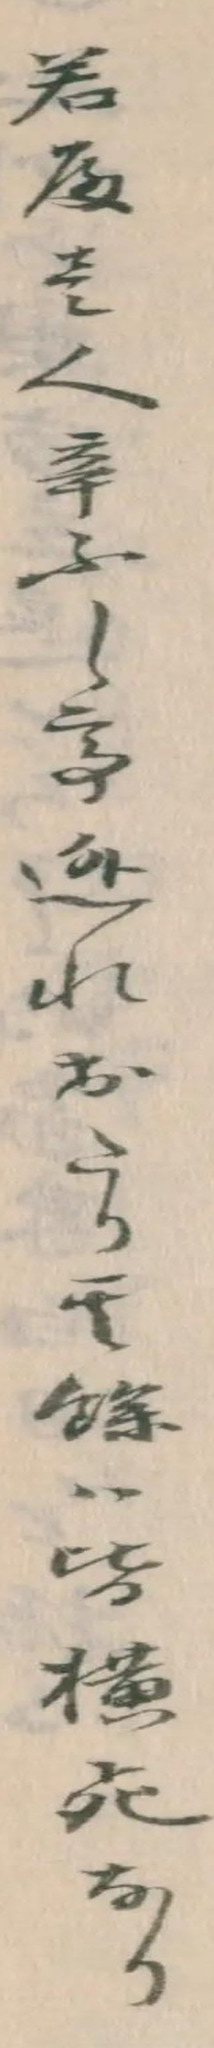若殿壱人辛ふして逃れ出たり其余は皆横死なり
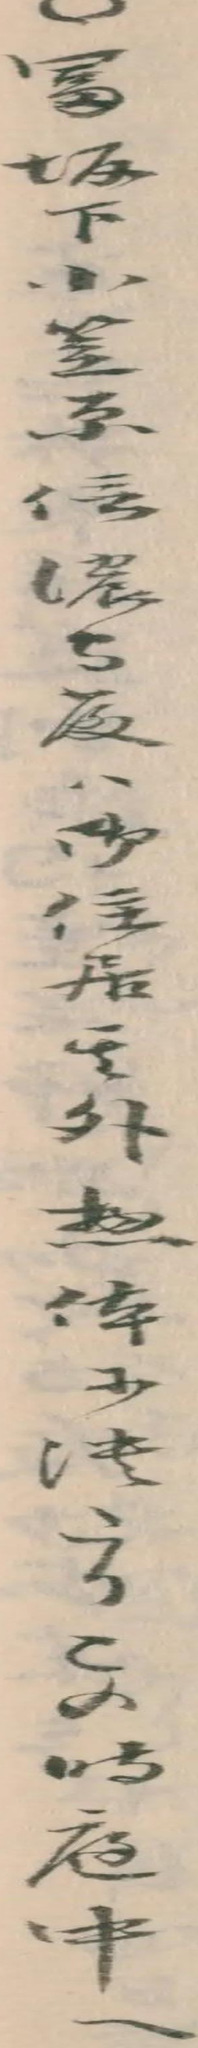〇冨坂下小笠原信濃守殿は御住居其外惣体に潰たりこの時庭中へ
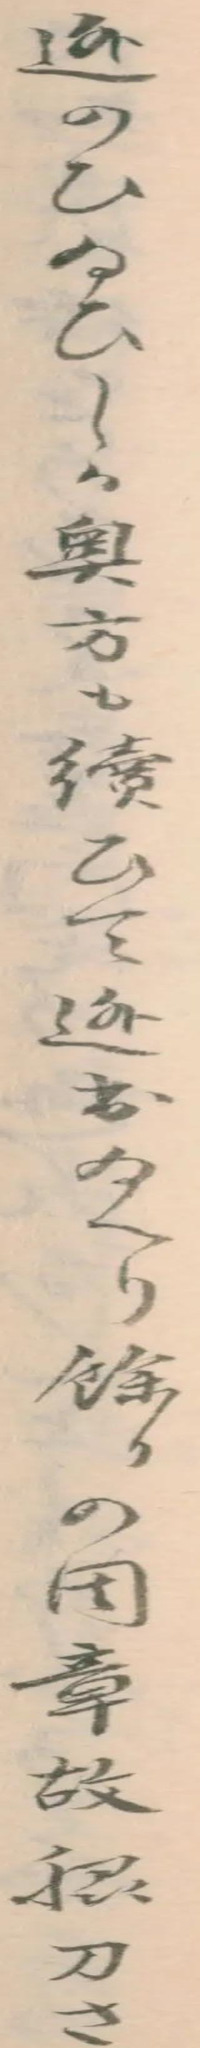逃のひ給ひしか奥方も続ひて逃出給へり余りの周章故脇刀さ
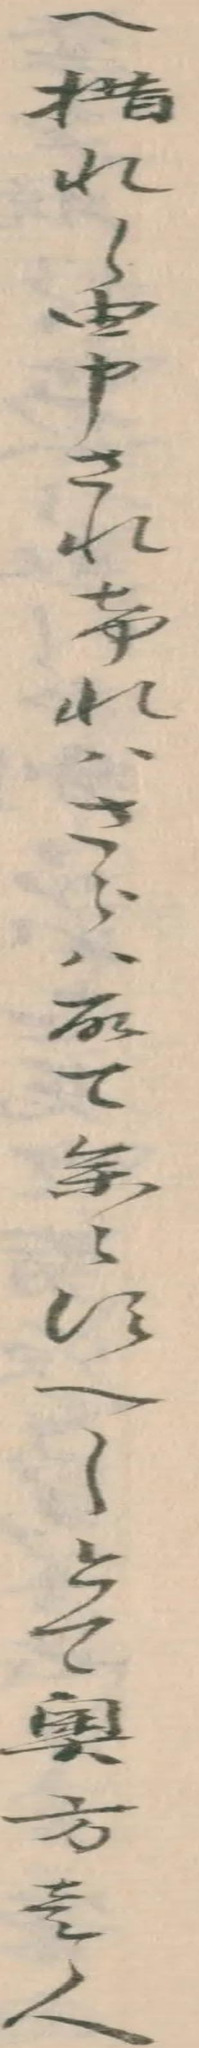へ措れし由申されけれはさらは取て参らすへしとて奥方壱人
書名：地災撮要. 巻10(地震之部) 上,下
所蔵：国立国会図書館 National Diet Library, JAPAN
